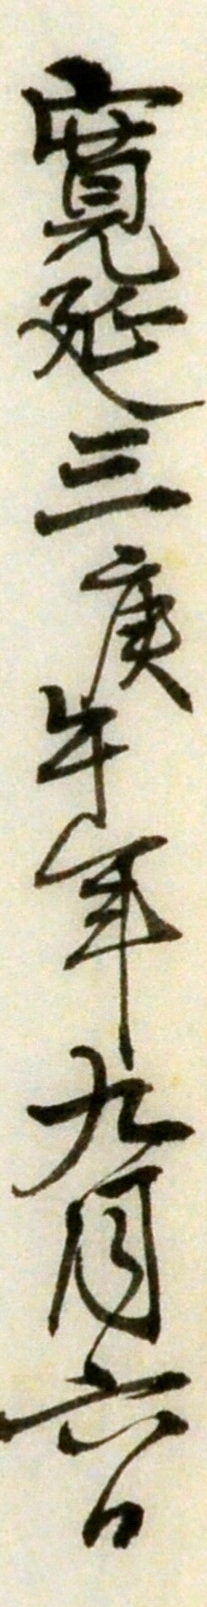寛延三庚午年九月六日

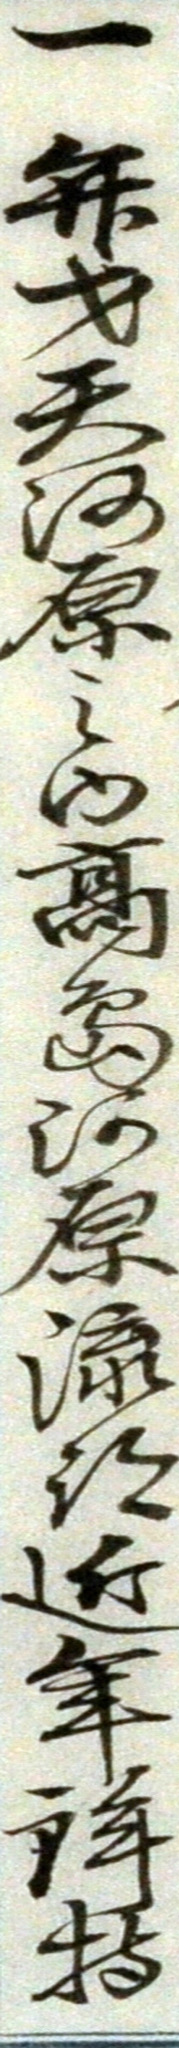一弁才天河原之内高島河原流跡近年鉾持
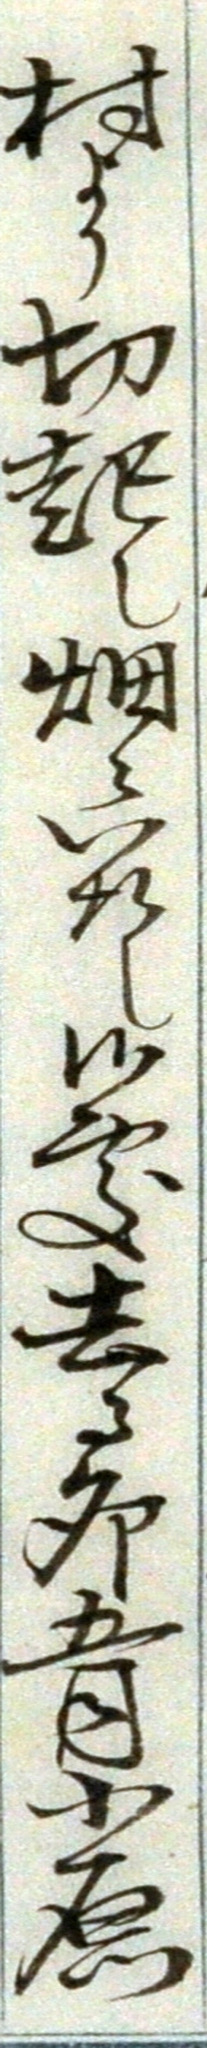村より切起し畑といたし候処去る卯五月小原
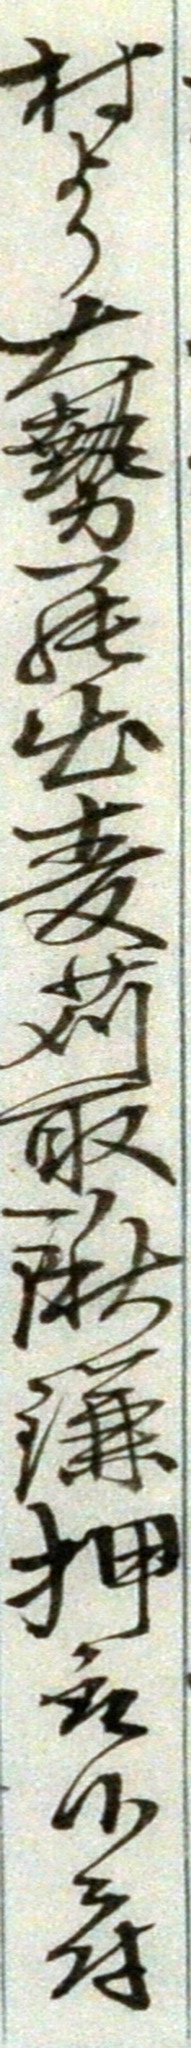村より大勢罷出麦苅取鍬鎌押取候ニ付
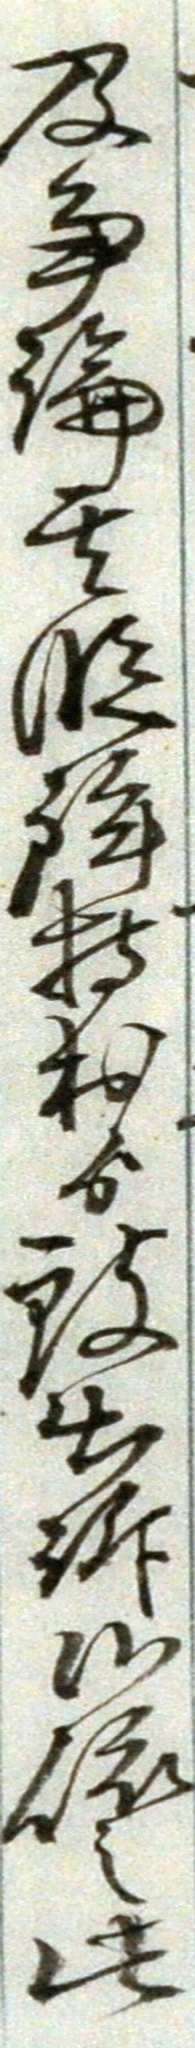及争論其段鉾持村ゟ致出訴候依之此
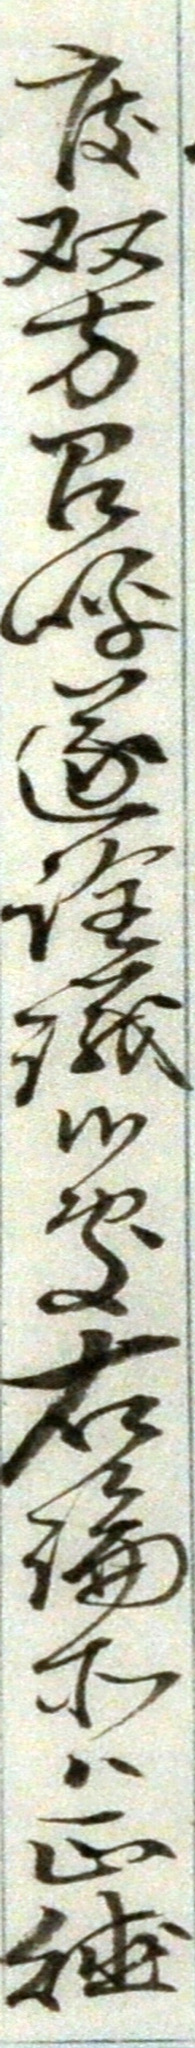度双方召呼遂詮議候処右論所ハ正徳
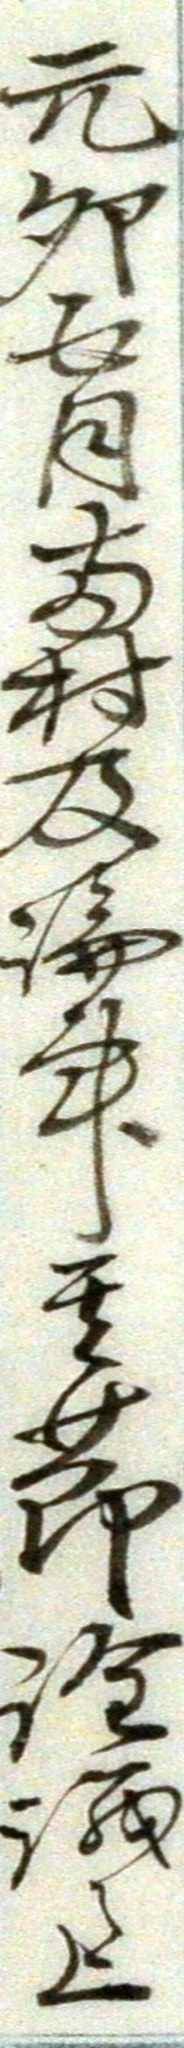元卯五月両村及論事其節詮議之上
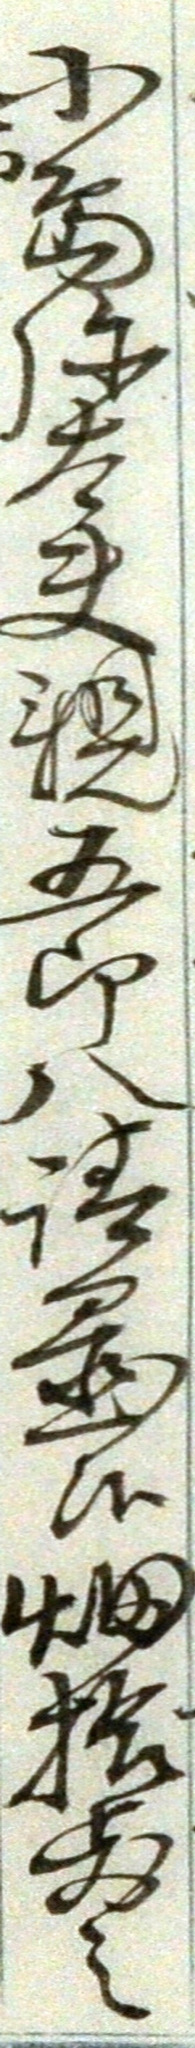小島弥太夫親五郎八請置候畑拾歩之
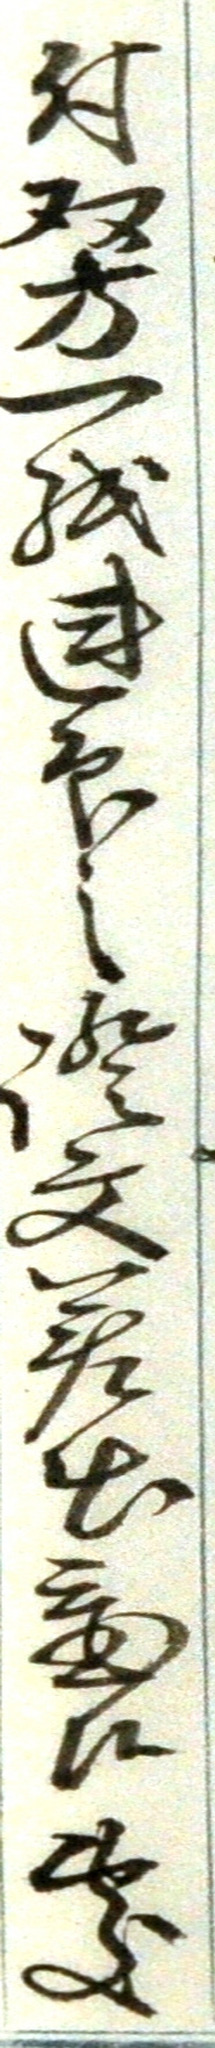付双方一紙連印之証文差出置候処

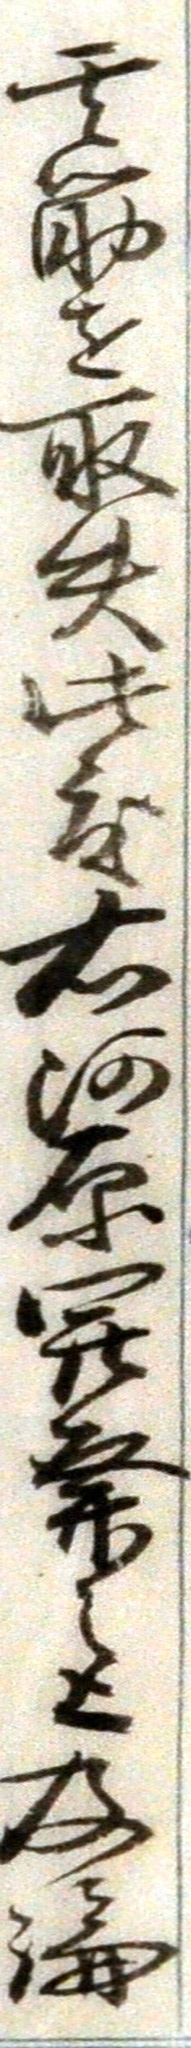其筋を取失此度右河原開発之上及論
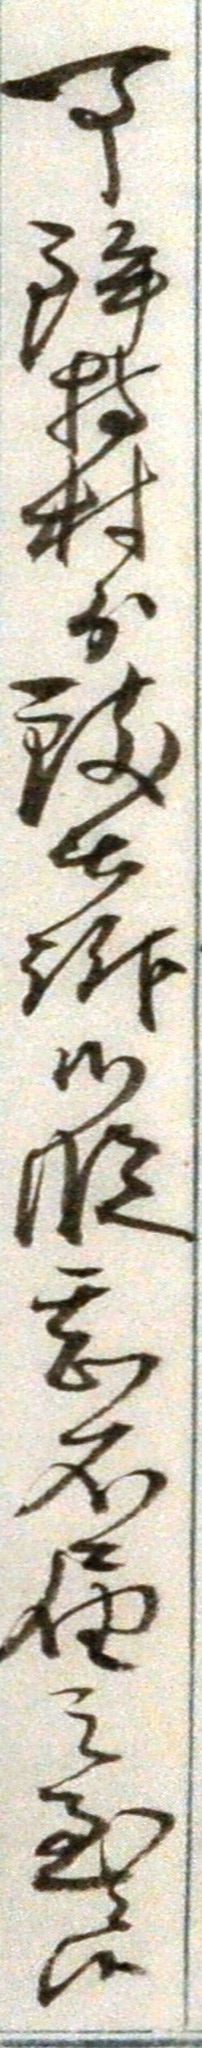事鉾持村ゟ致出訴候段甚不届之至ニ候
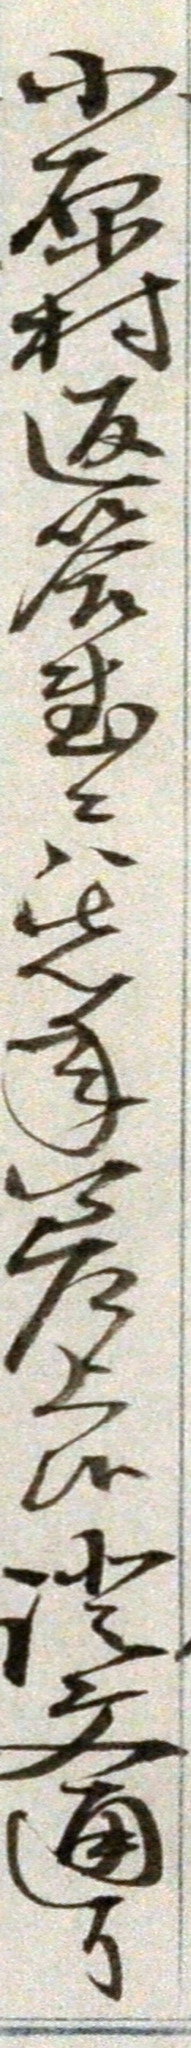小原村返答書ニハ先年差上候証文通り
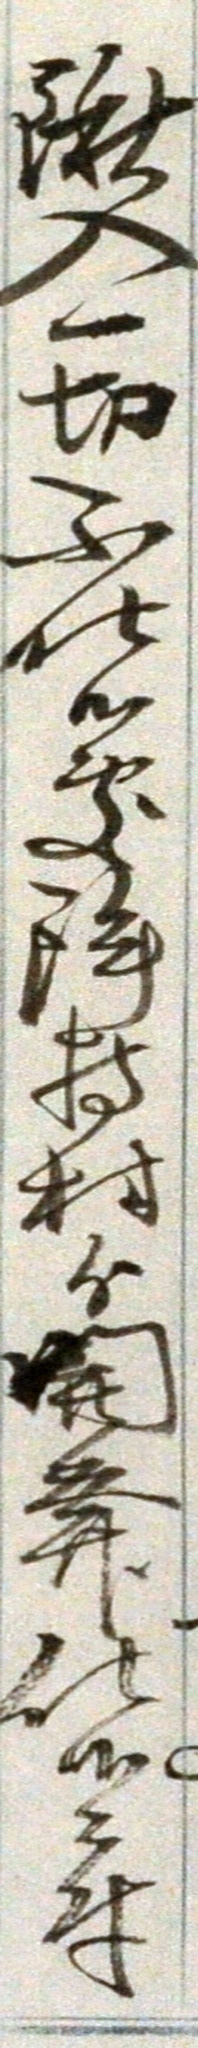鍬入一切不仕候処鉾持村ゟ開発仕候ニ付
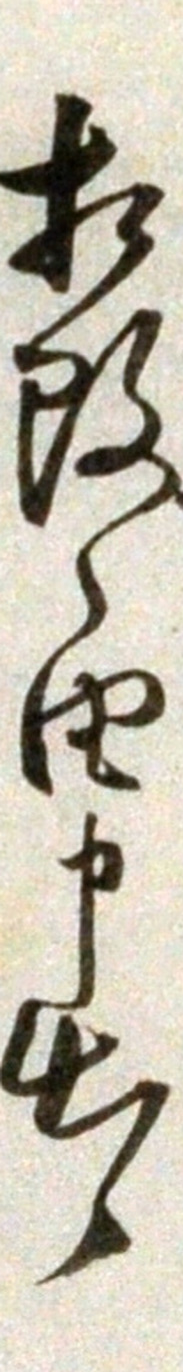相改候由申出候
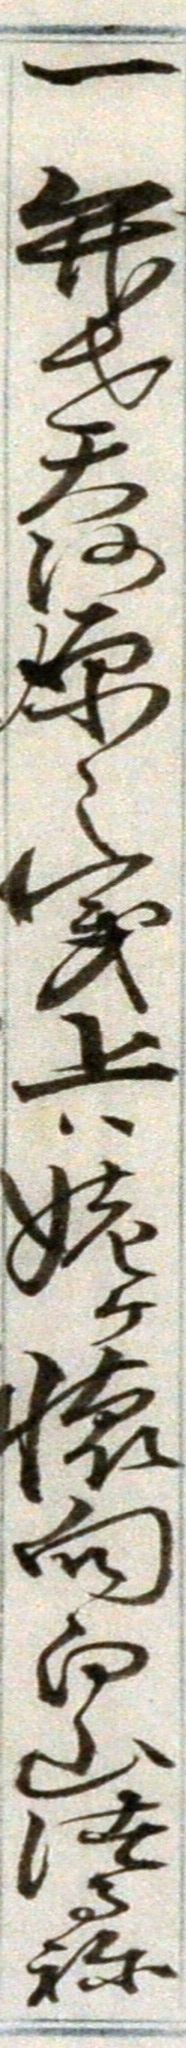一弁才天河原之義上ハ姥ケ懐向白山つるね
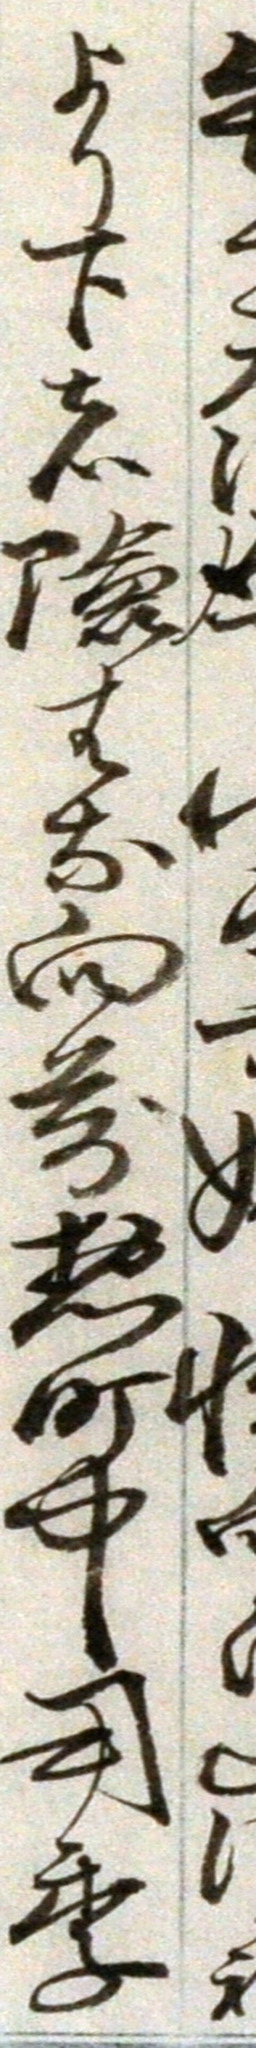より下は険はな向前惣町中用季
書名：鉾持村・小原村申渡裁許状
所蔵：伊那市立高遠町図書館・合同会社AMANE
